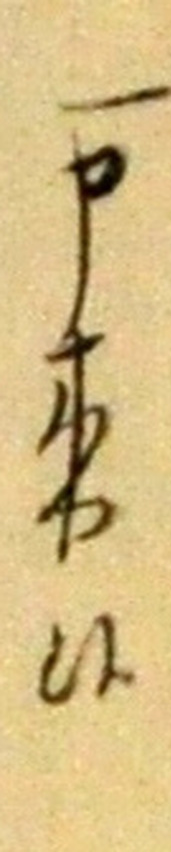申来候
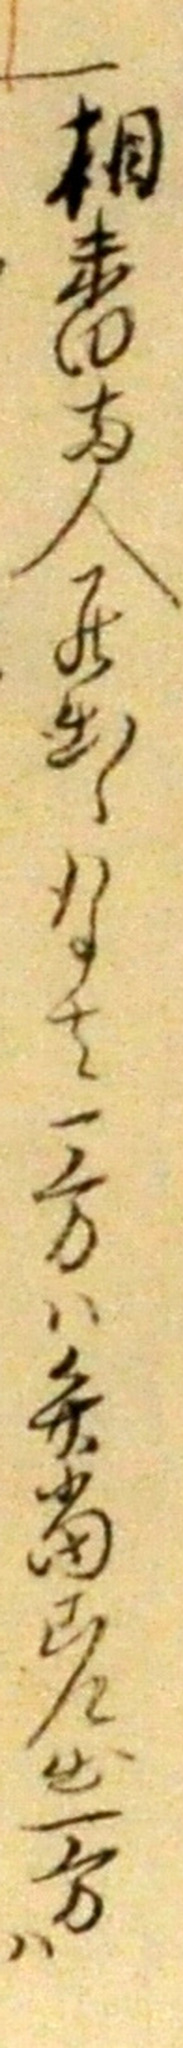相番両人罷出候得は一方は弁当差出一方は
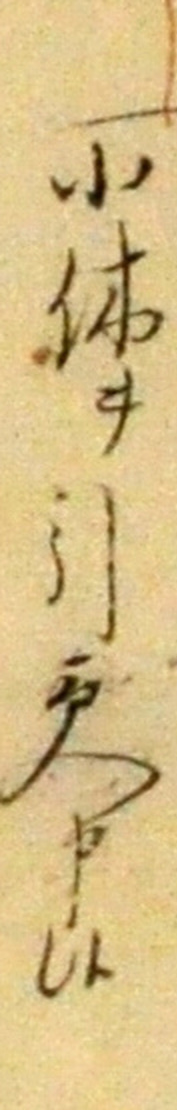小休ヲ引受申候
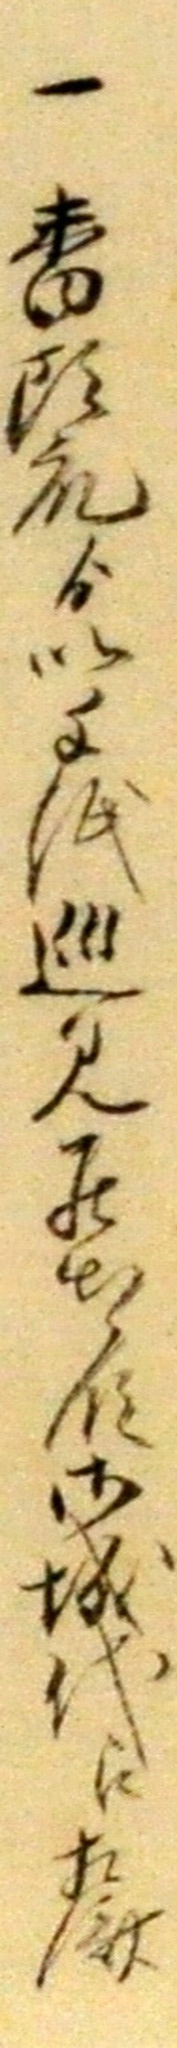一番頭衆ゟ以手紙巡見罷出候段御城代え相済
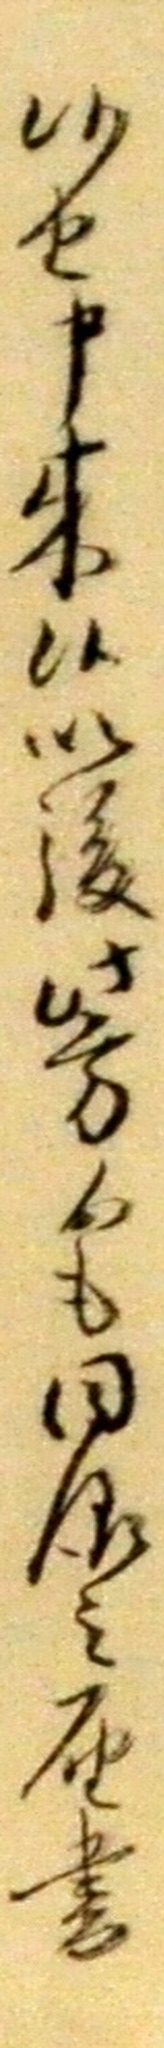候由申来候以後此方ゟも同様之届書
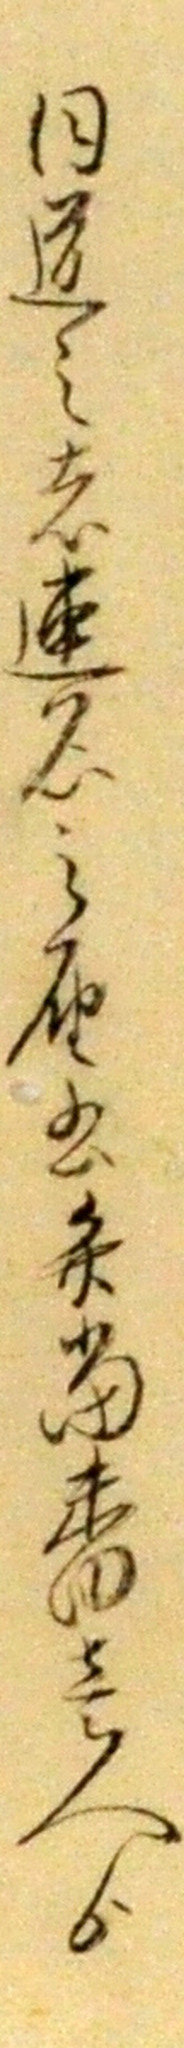同道之者連名之届書弁当番壱人ゟ
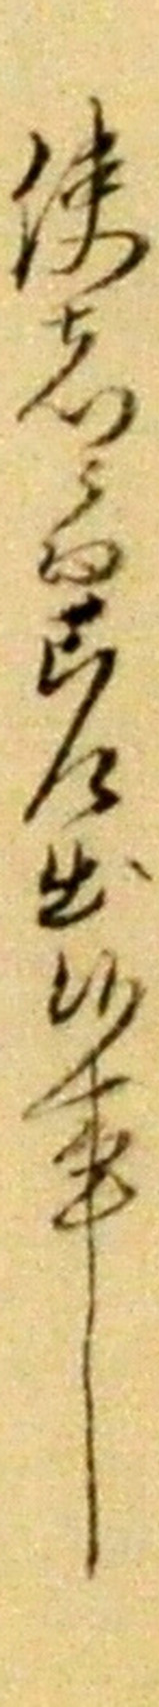使者に而差出候事
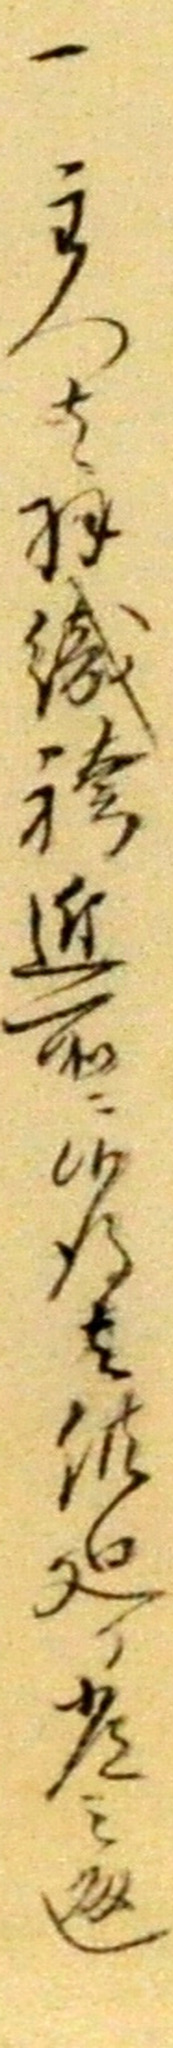一主人は羽織袴近所に候得は供廻り常之通
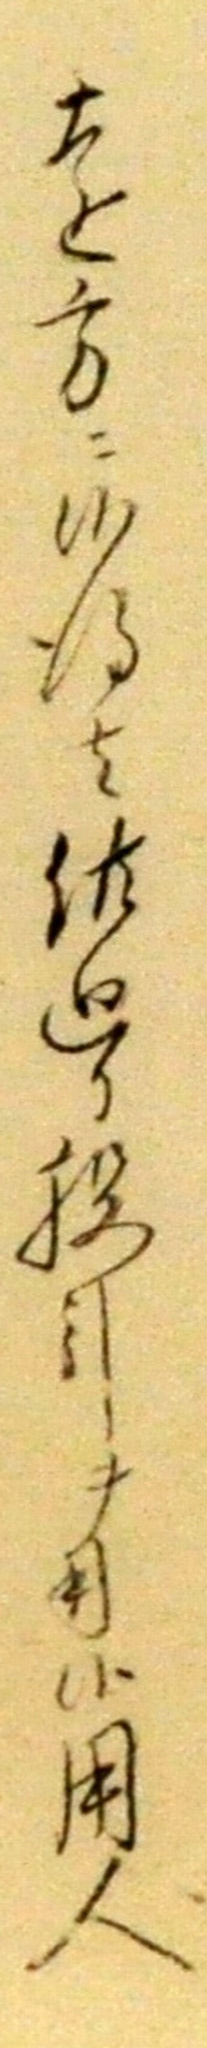遠方に候得は供廻り股引ヲ用候用人
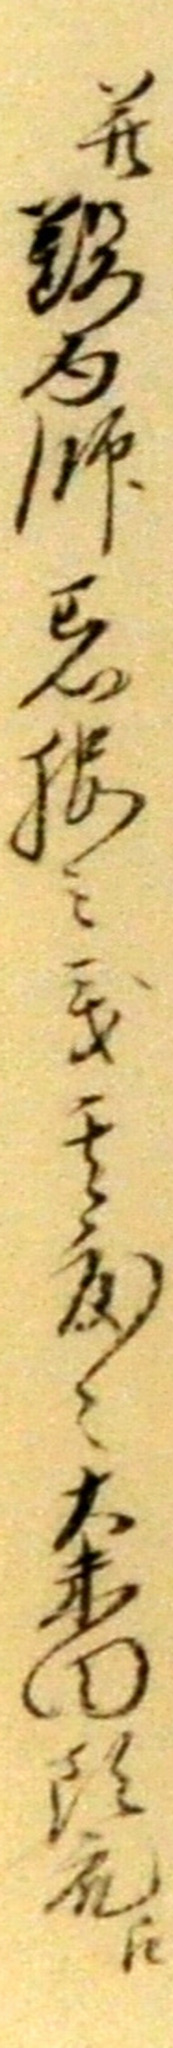并医師着服之義其度之大番頭衆え

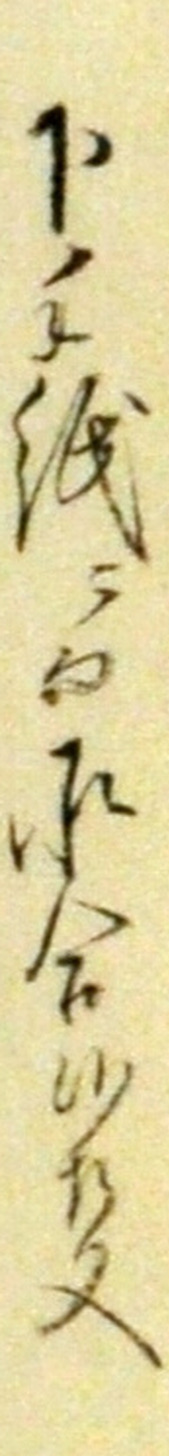下手紙に而承合候事
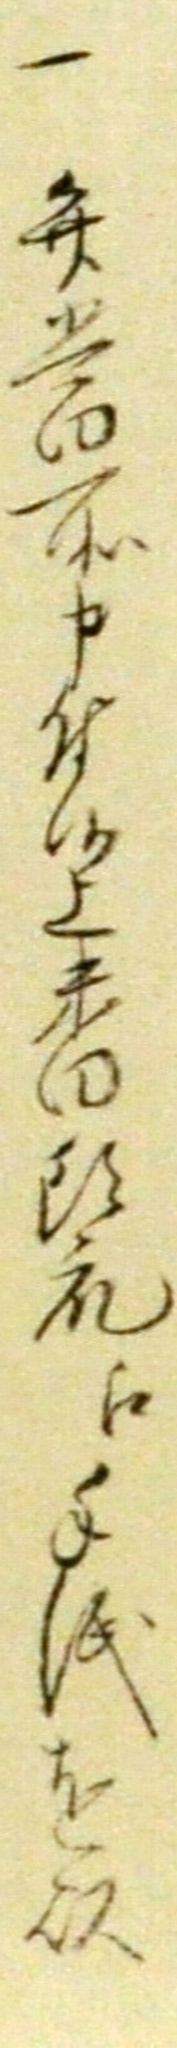一弁当所申付候上番頭衆え手紙を以
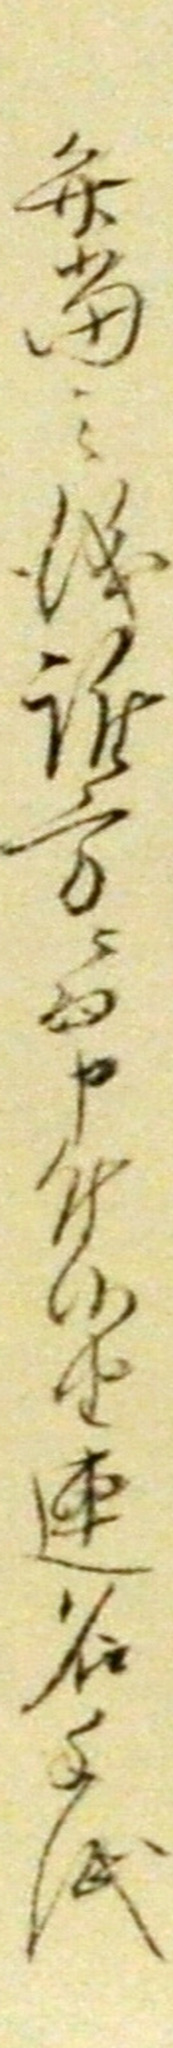弁当之儀誰方に而申付候由連名手紙
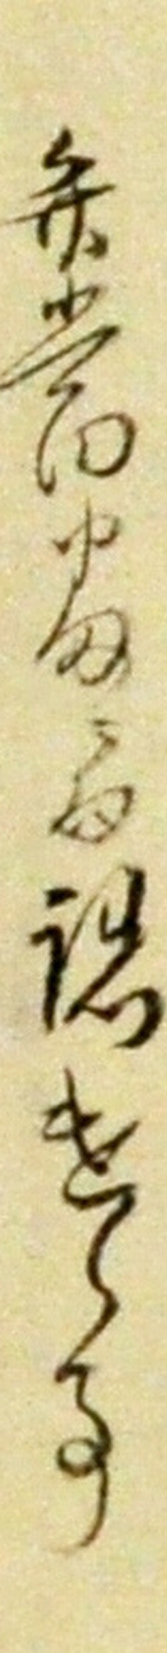弁当番に而認遣候事
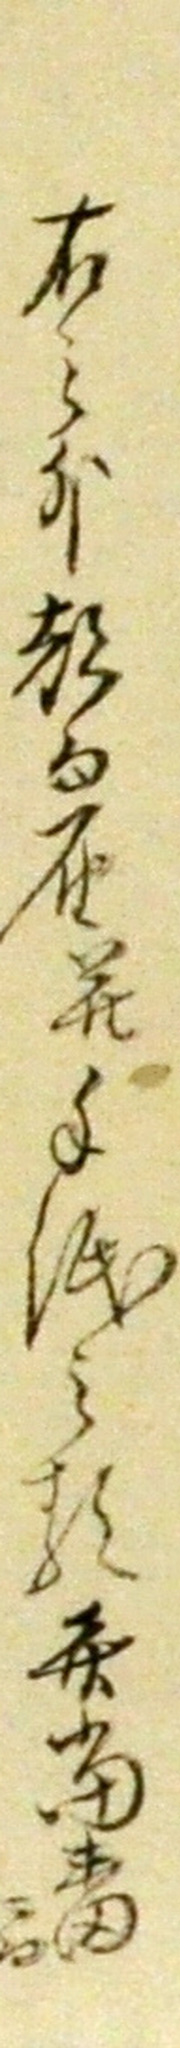右之外都而届并手紙之類弁当番に而
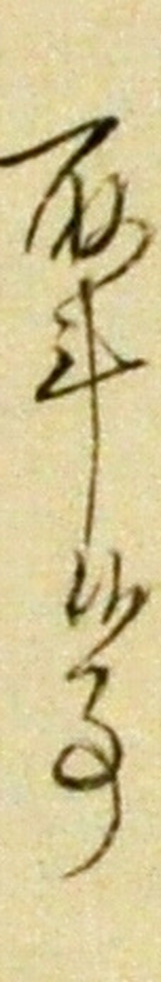取計候事
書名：大阪加番関係諸書留〔一括〕
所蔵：伊那市立高遠町図書館・合同会社AMANE
